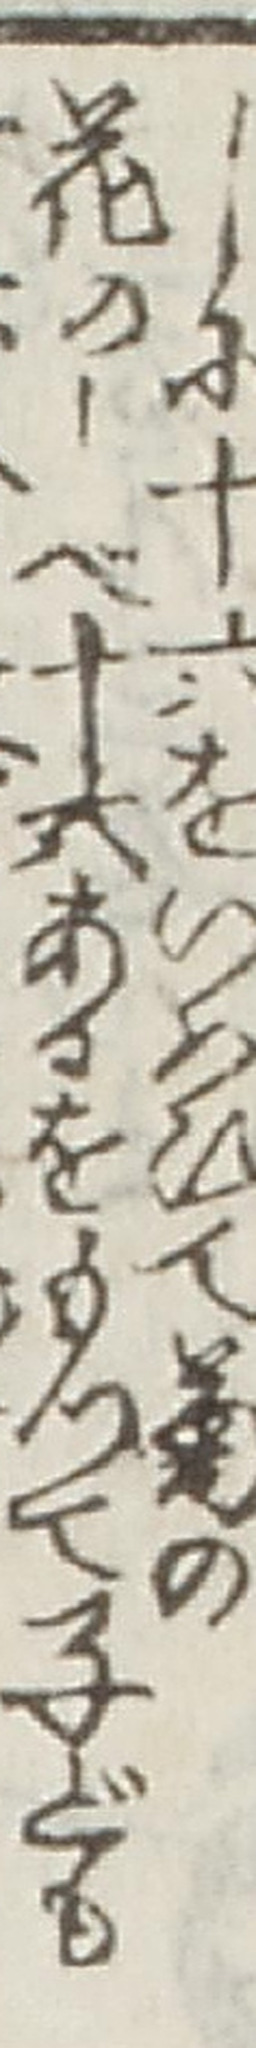花のしべ十六あるをもつて子ども
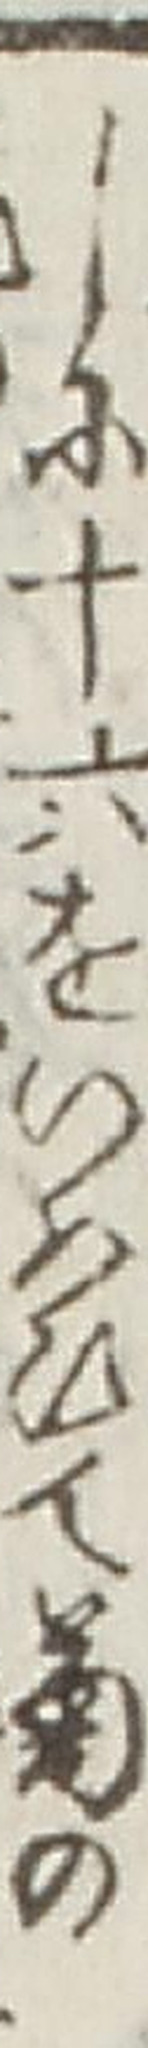しに十六をいハひて菊の
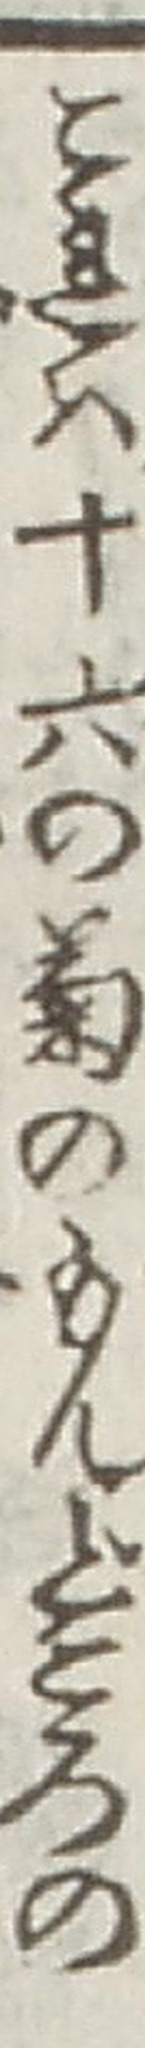これハ十六の菊のもんどころの
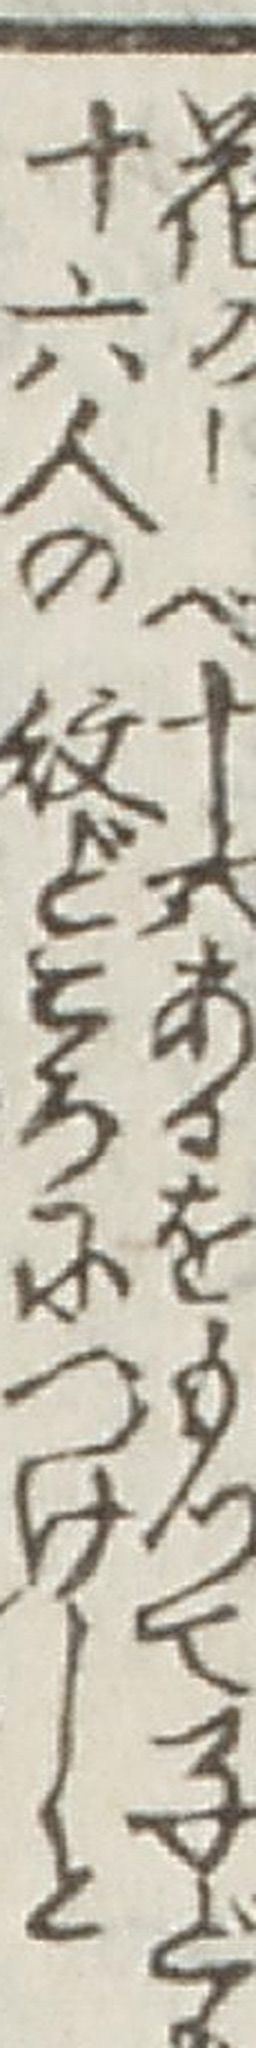十六人の紋どころにつけしと
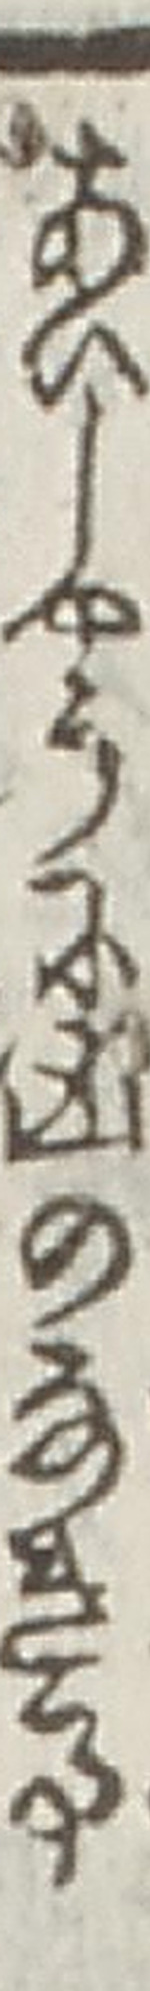あいしやうに凶のなき事
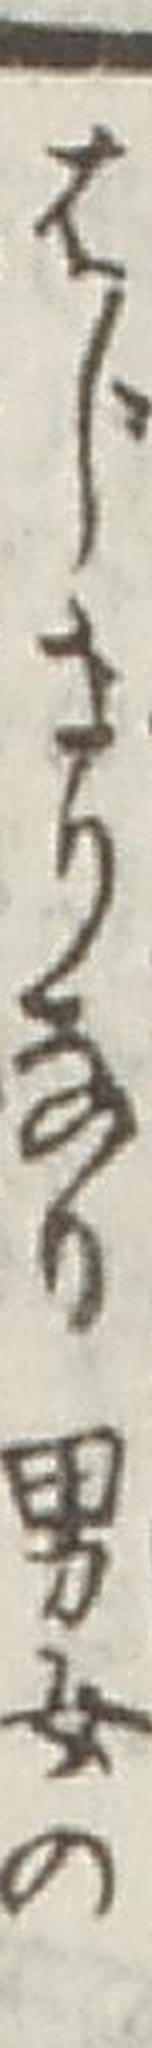はじまりなり男女の
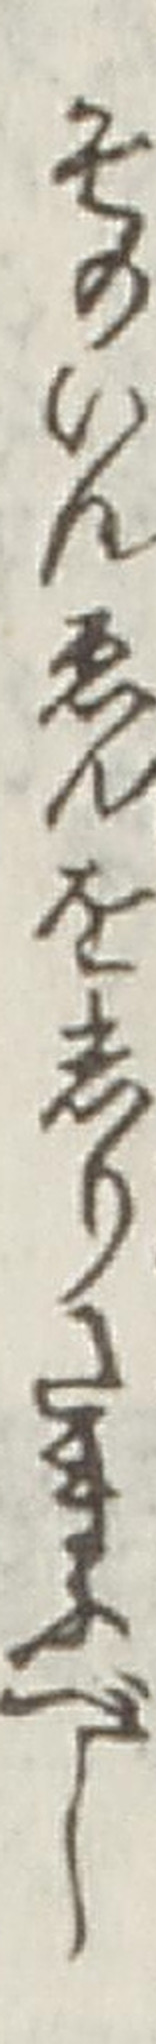そのいんゑんをしりたまふべし
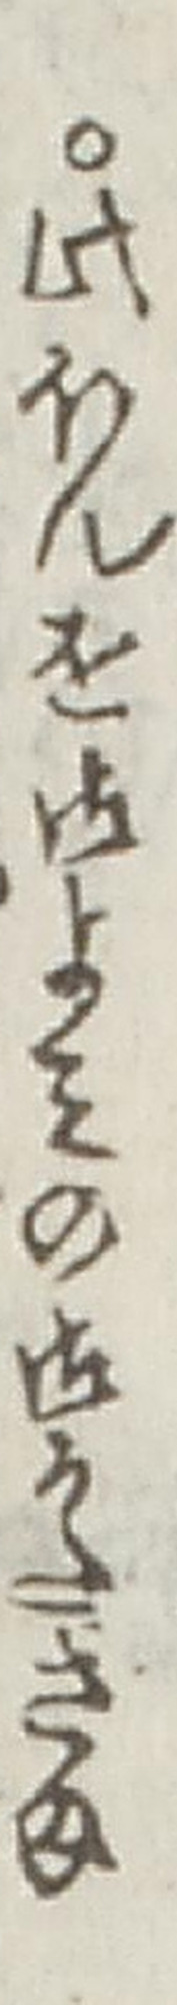〇此ふんを御よミの御かたさま
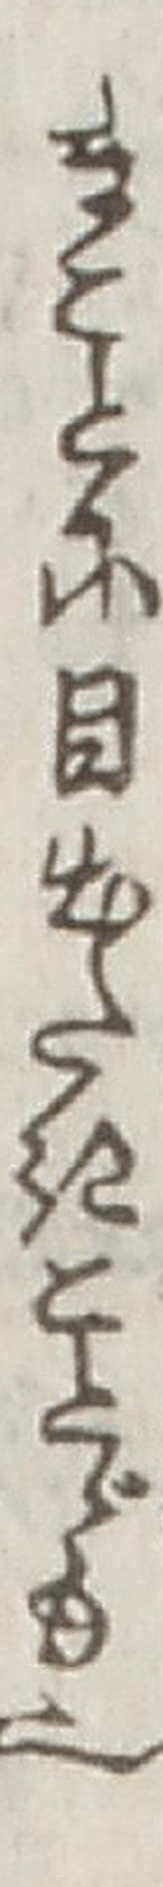まことに目出たきことゞも也
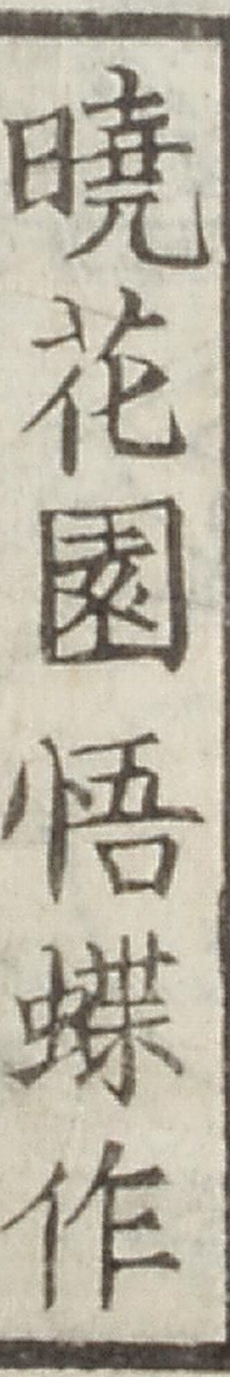曉花園悟蝶作
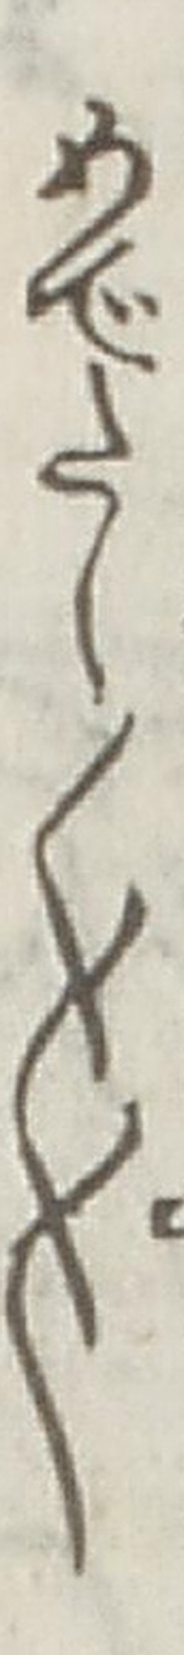めでたし〳〵〳〵〳〵
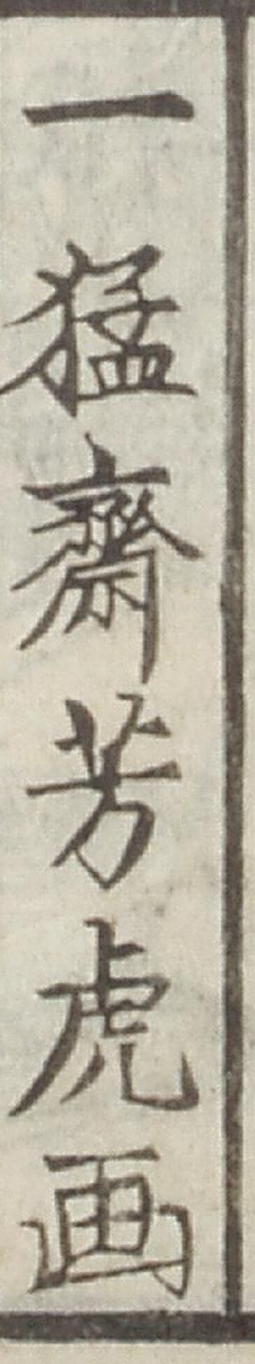一猛齋芳虎画
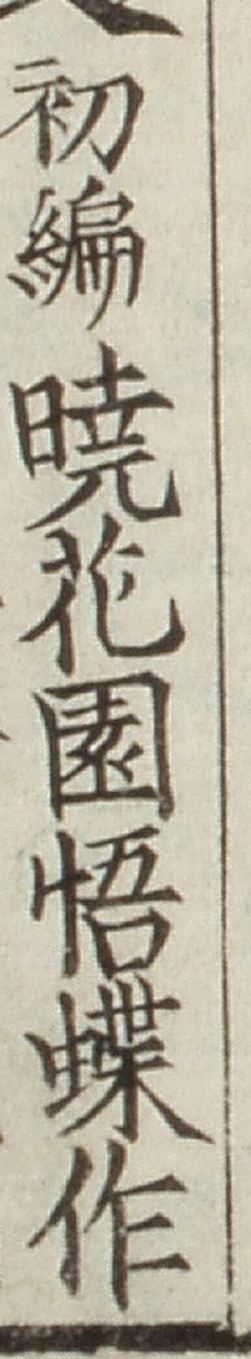曉花園悟蝶作
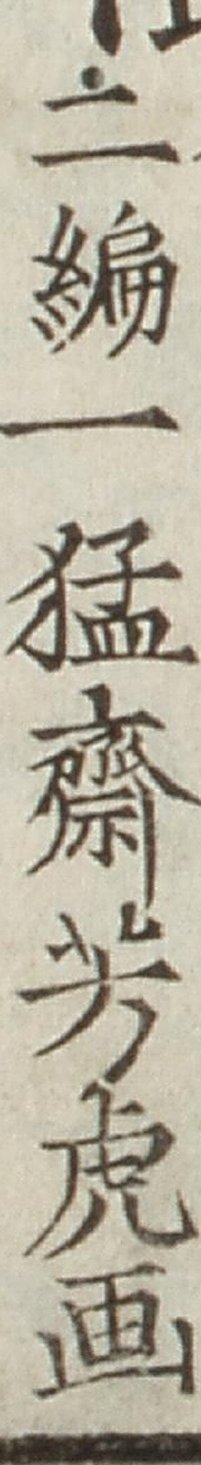一猛齋芳虎画
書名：三世相出雲當座帳　上下冊
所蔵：東京大学地震研究所図書室 Earthquake Research Institute Library, The University of Tokyo, JAPAN
